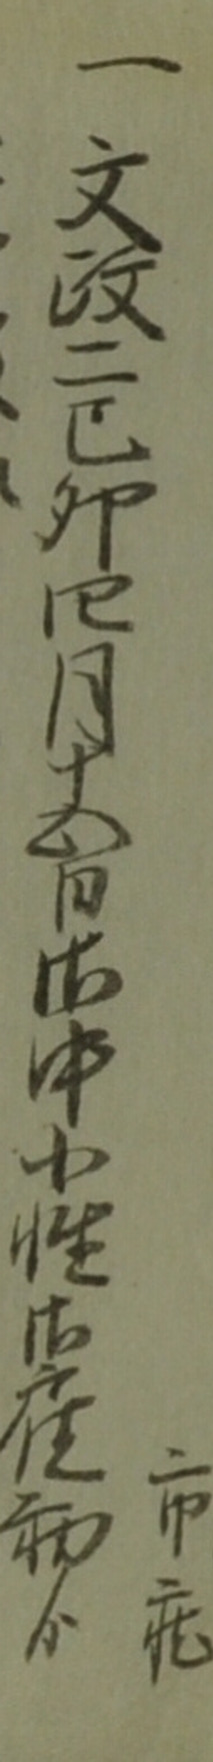一文政二己卯四月十五日御中小性御雇勤ゟ
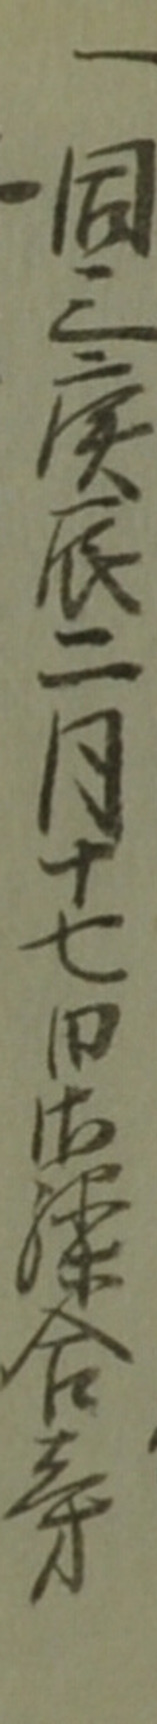一同三庚辰二月十七日御繰合旁
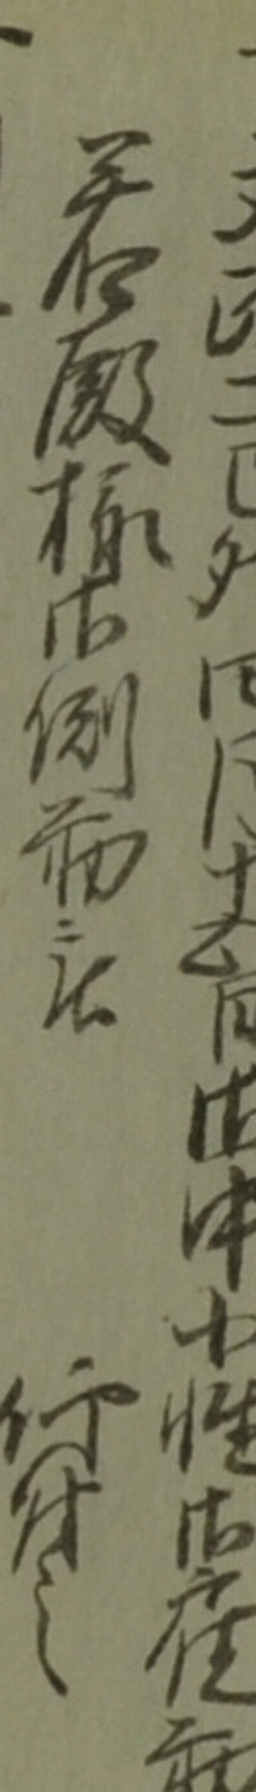若殿様御側勤被仰付之
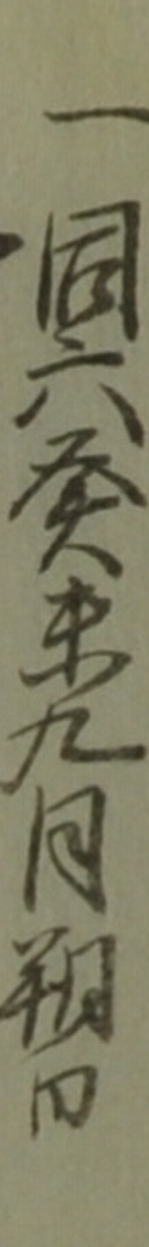一同六癸未九月朔日
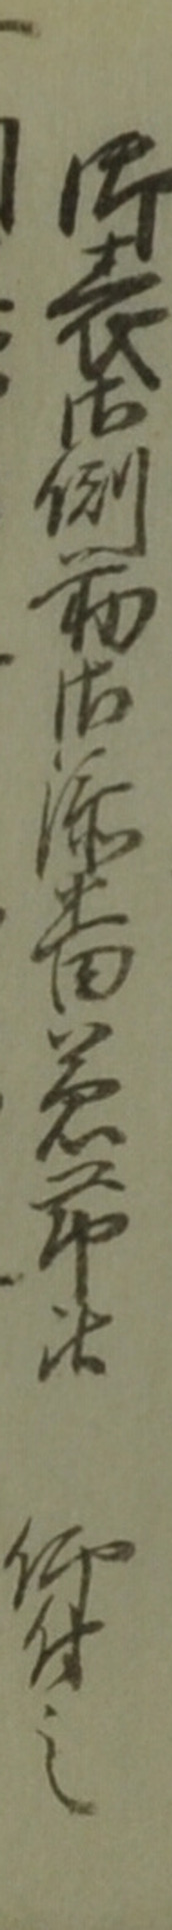御表御側勤御添番兼帯被仰付之
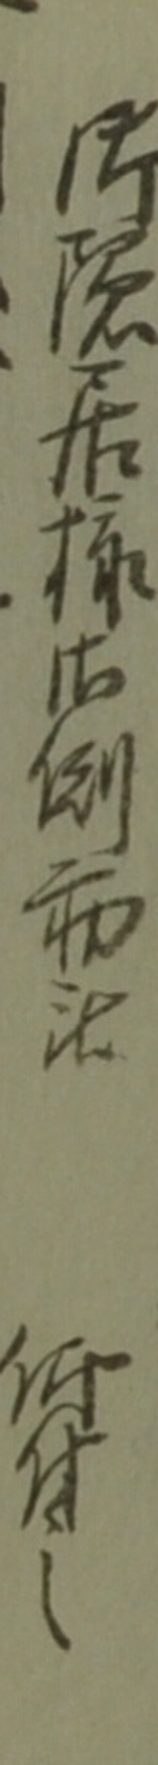御隠居様御側勤被仰付之
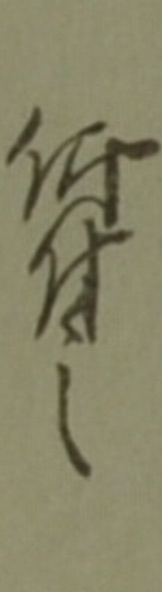仰付之
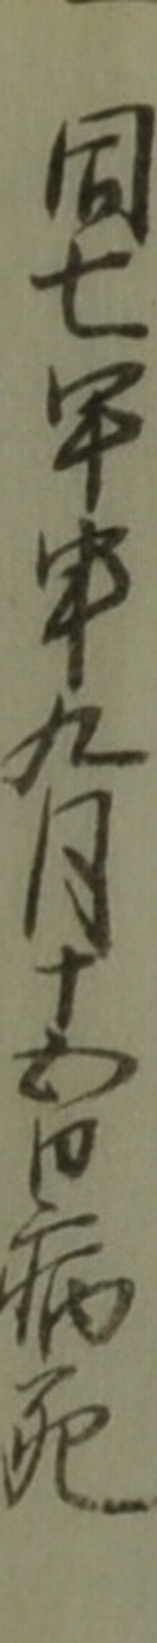一同七甲申九月十五日病死
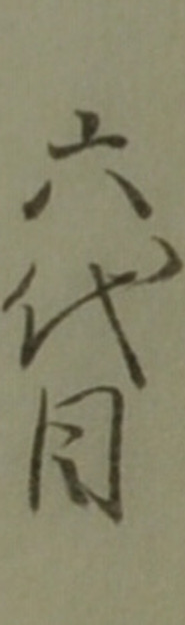六代目
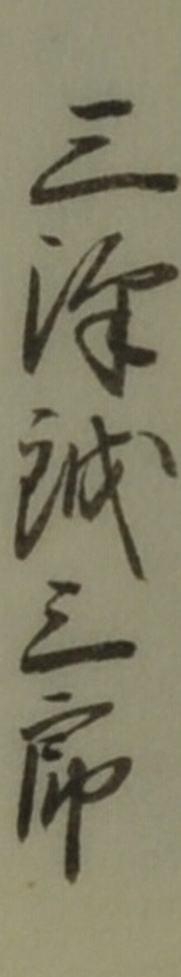三沢誠三郎
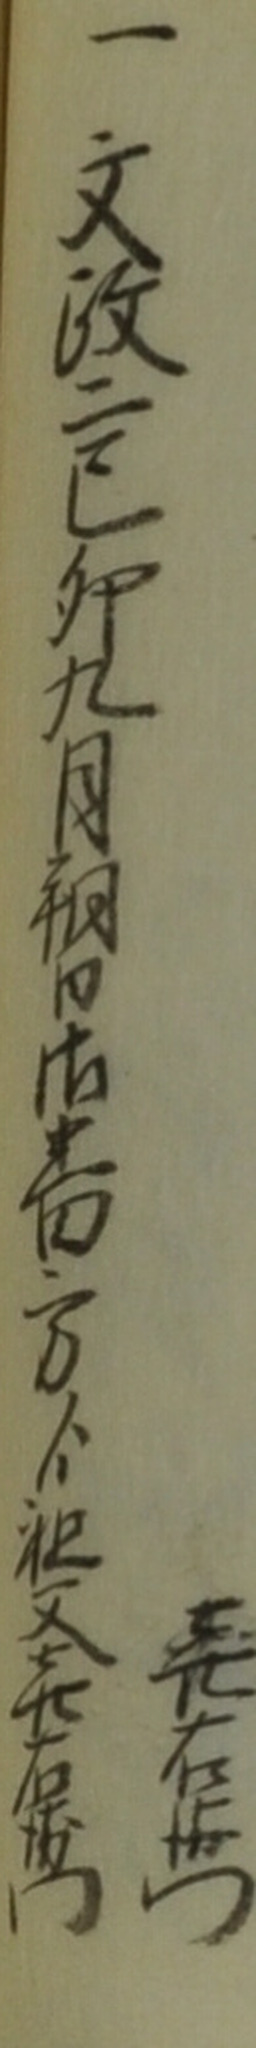一文政二己卯九月朔日御番方ゟ祖父喜右衛門
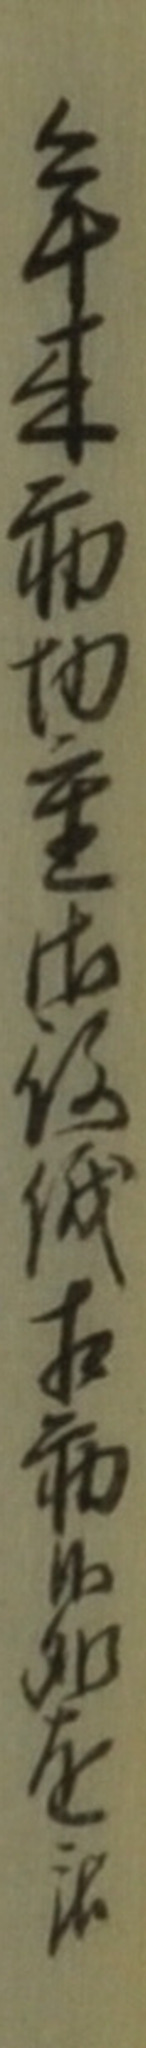年来勤切重御役儀相勤候処を被
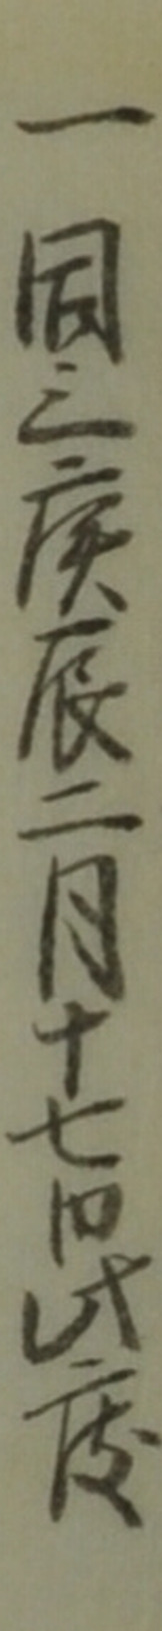一同三庚辰二月十七日此度
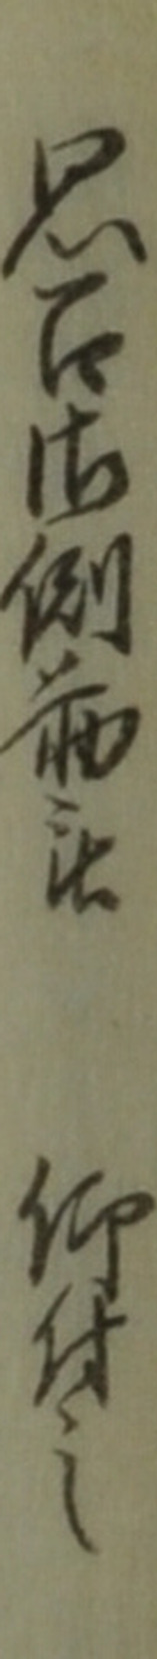思召御側勤被仰付之
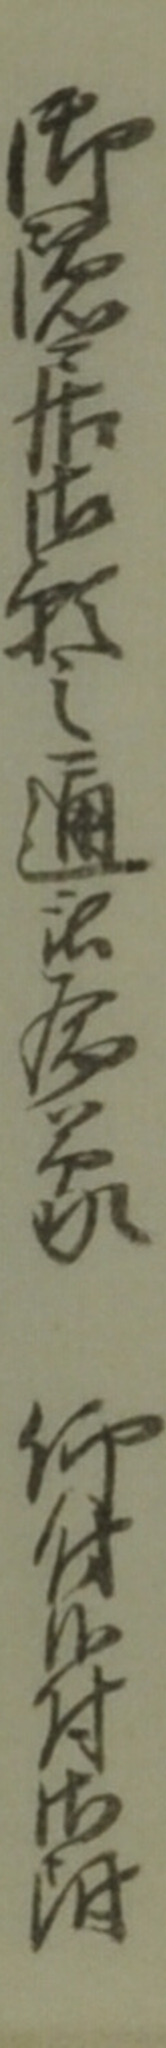御隠居御願之通被為蒙仰付候付御附
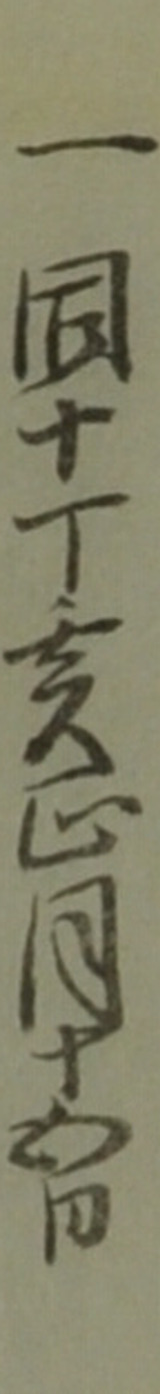一同十丁亥正月十五日
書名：諸御役代々録（五）
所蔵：伊那市立高遠町図書館・合同会社AMANE
